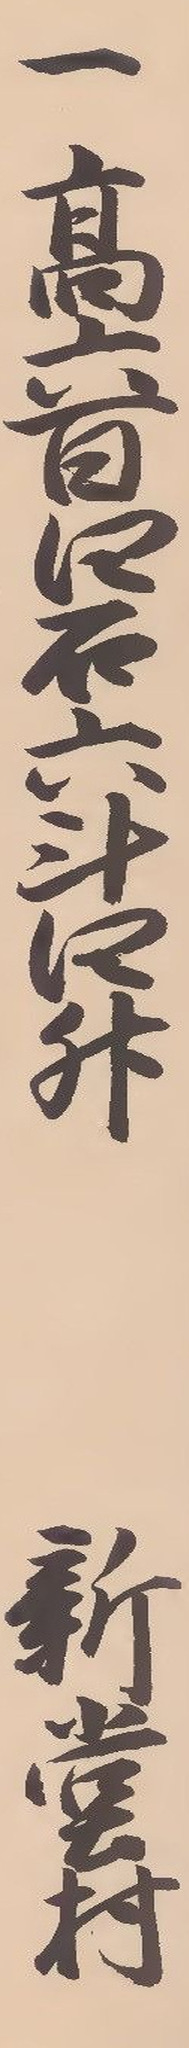一高六百四石六斗四升新堂村
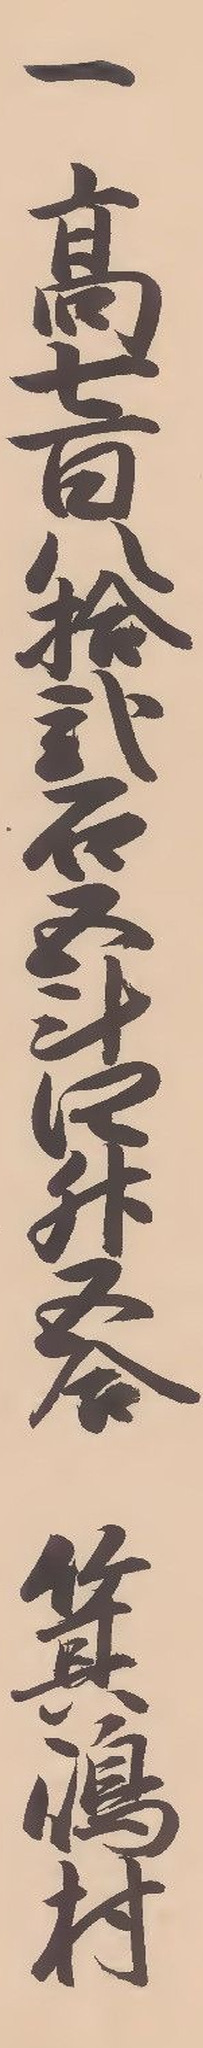一高七百八拾弐石五斗四升五合箕島村
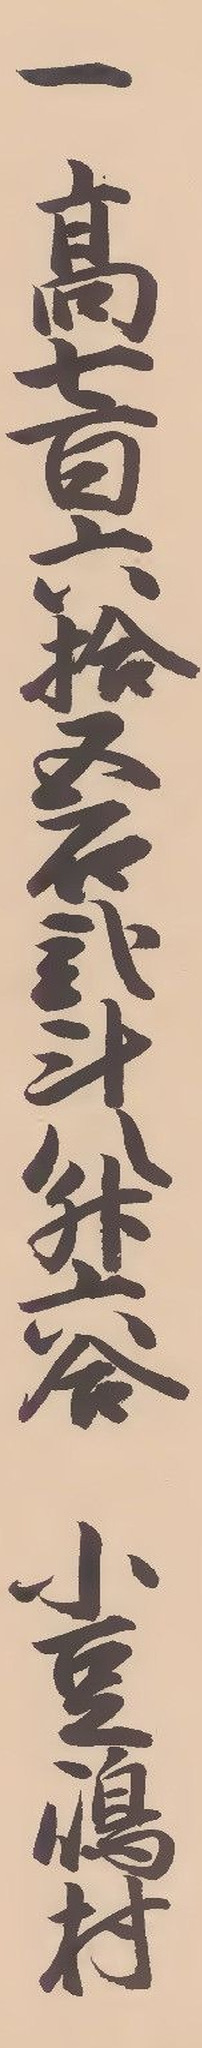一高七百六拾五石弐斗八升六合小豆島村

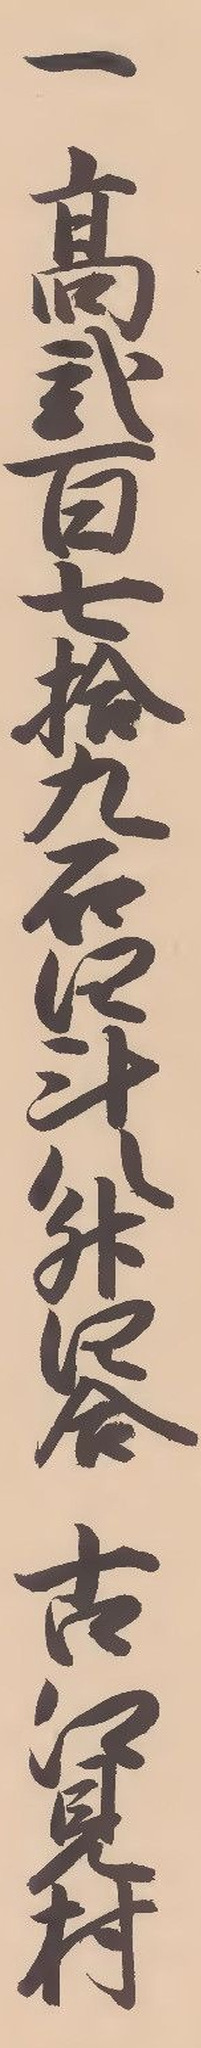一高弐百七拾九石四斗八升四合古江見村
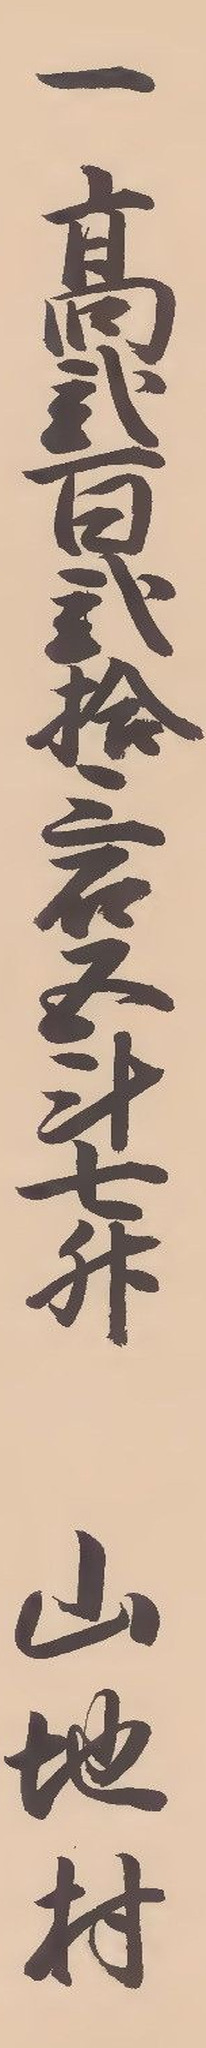一高弐百弐拾三石五斗七升山地村
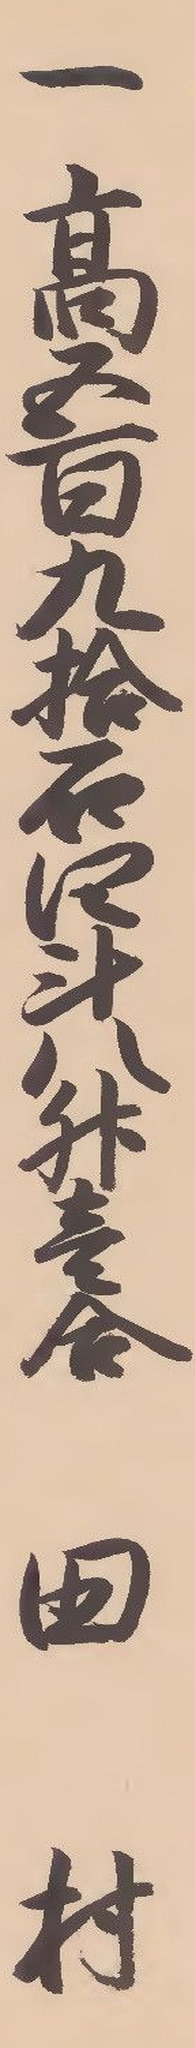一高五百九拾石四斗八升壱合田村
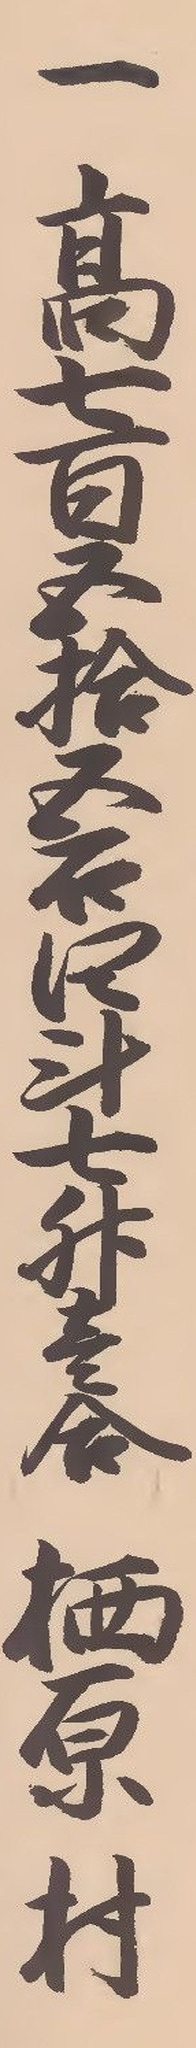一高七百五拾五石四斗七升壱合栖原村
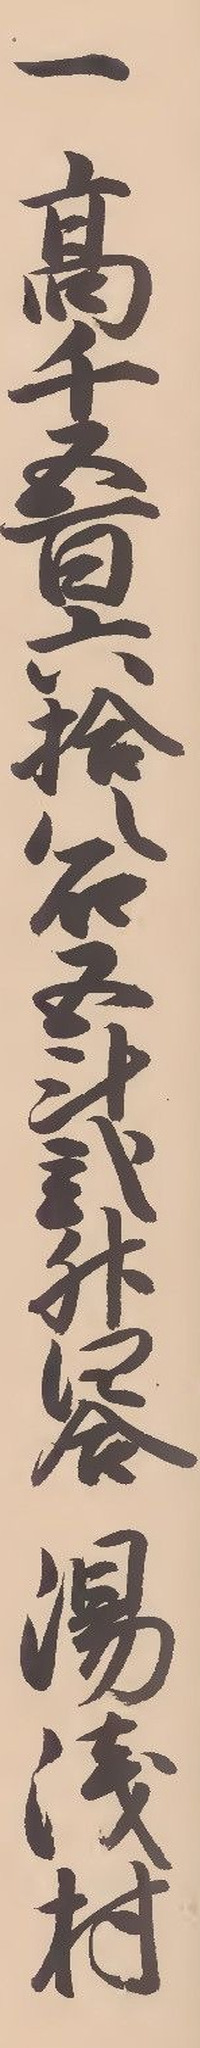一高千五百六拾八石五斗弐升四合湯浅村
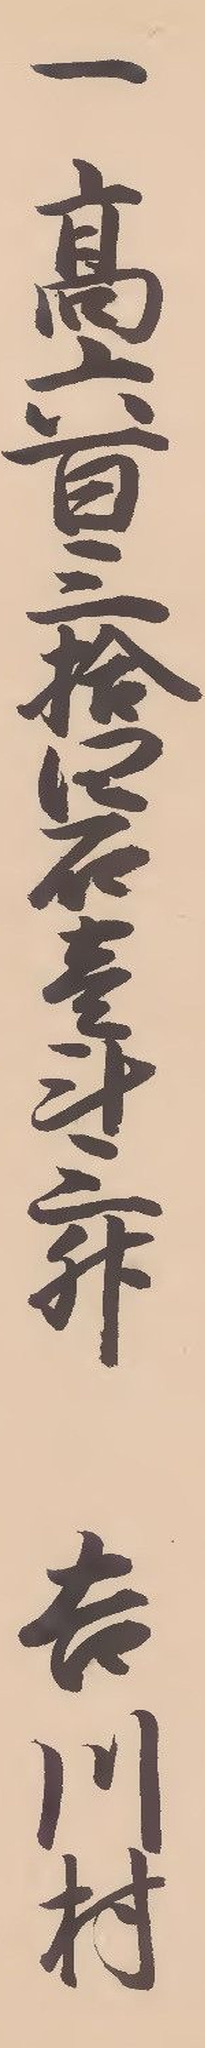一高六百三拾四石壱斗三升吉川村
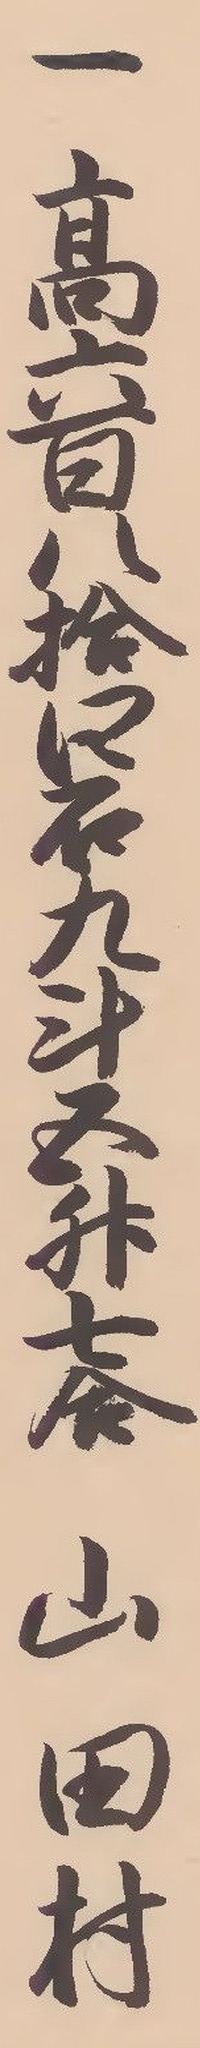一高六百八拾四石九斗五升七合山田村

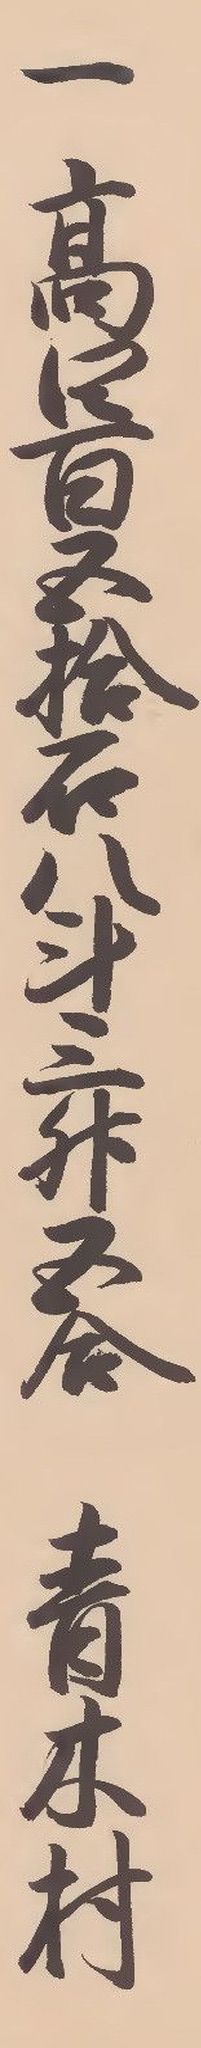一高四百五拾石八斗三升五合青木村
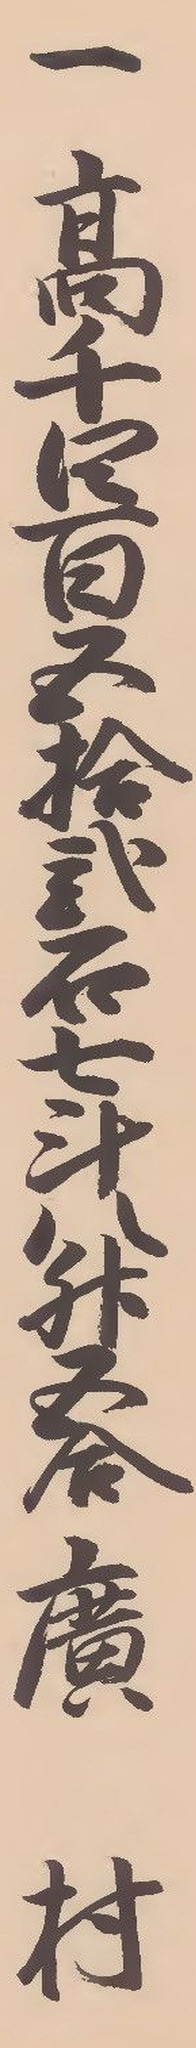一高千四百五拾弐石七斗八升五合広村
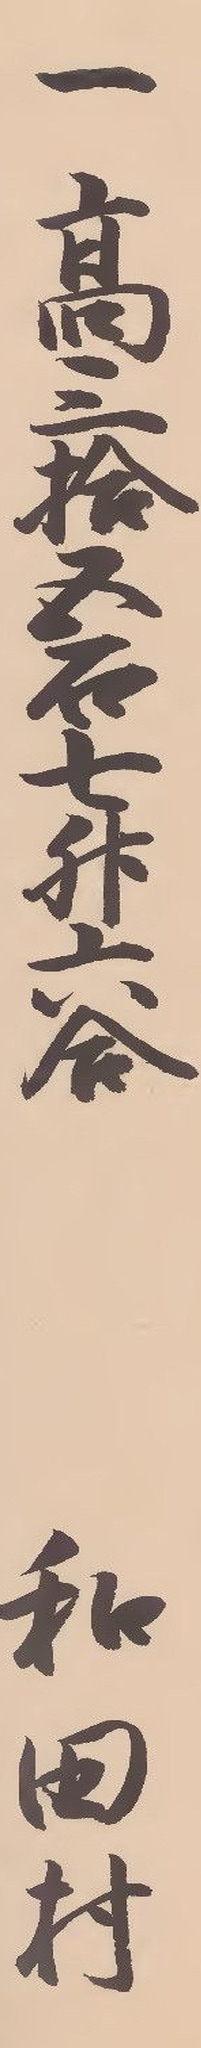一高三拾五石七升六合和田村
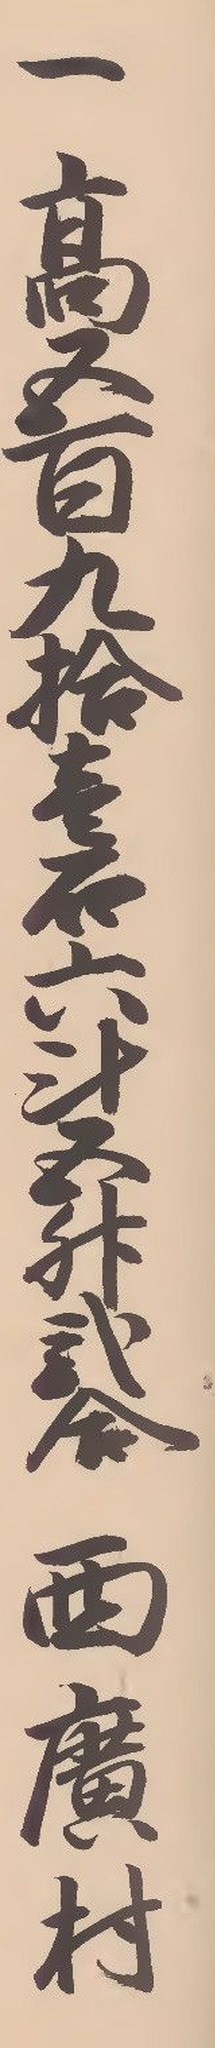一高五百九拾壱石六斗五升弐合西広村
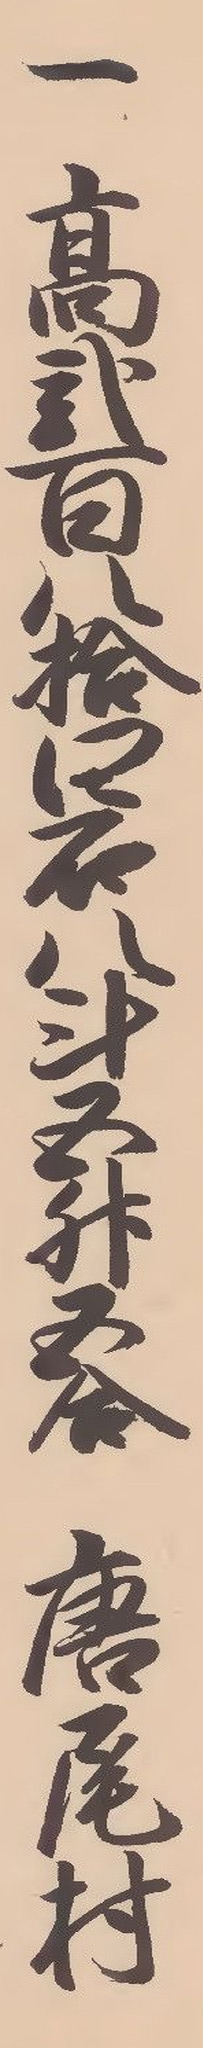一高弐百八拾四石八斗五升五合唐尾村
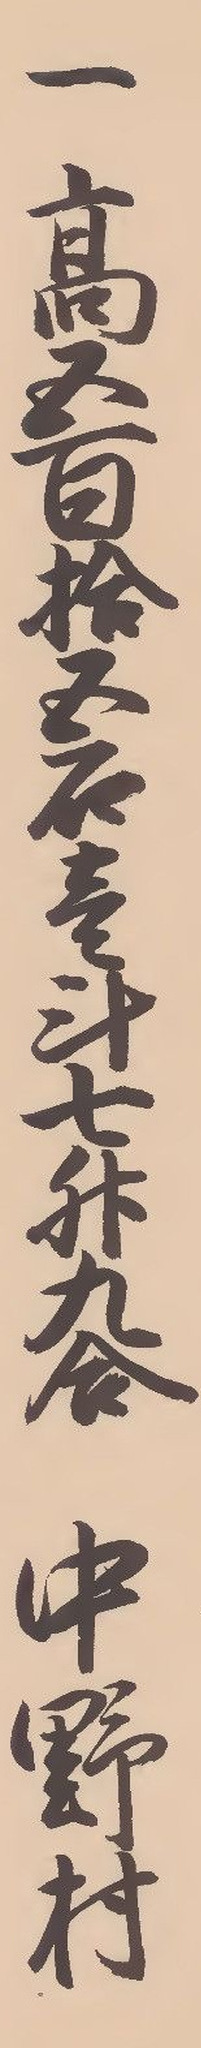一高五百拾五石壱斗七升九合中野村
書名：紀伊国郷帳
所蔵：国立公文書館 National Archives of Japan
